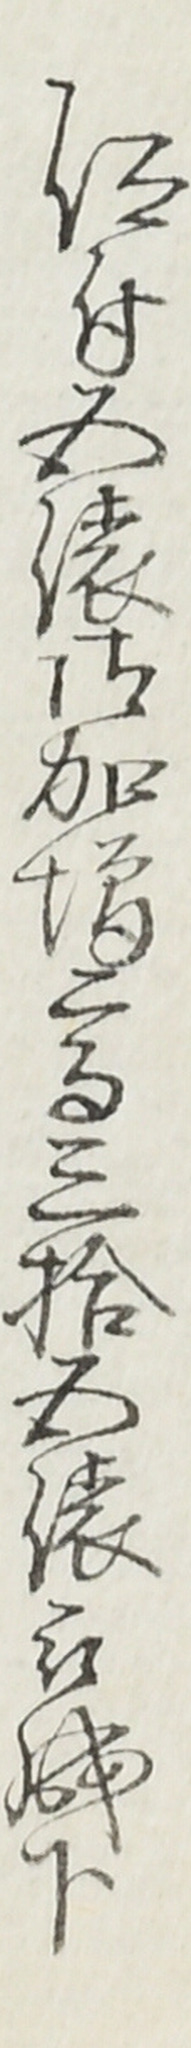仰付五俵御加増高三拾五俵被成下
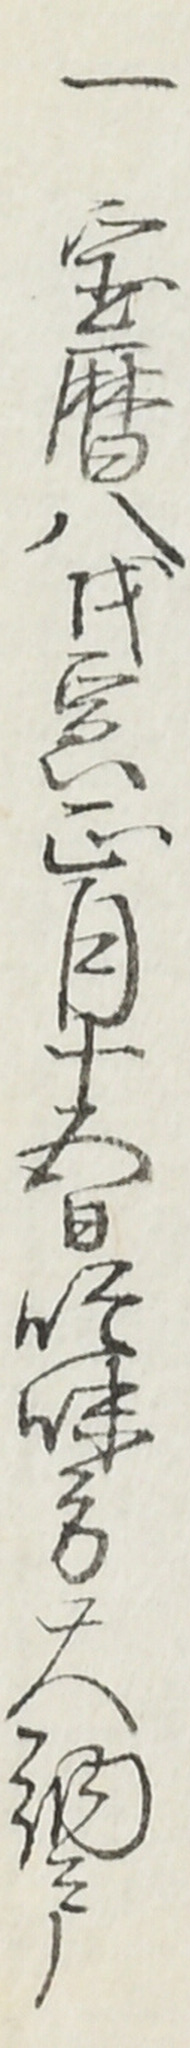一宝暦八戊寅正月十五日吟味方大納戸
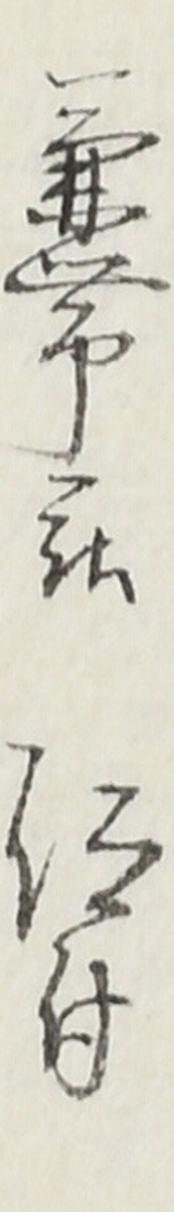兼帯被仰付
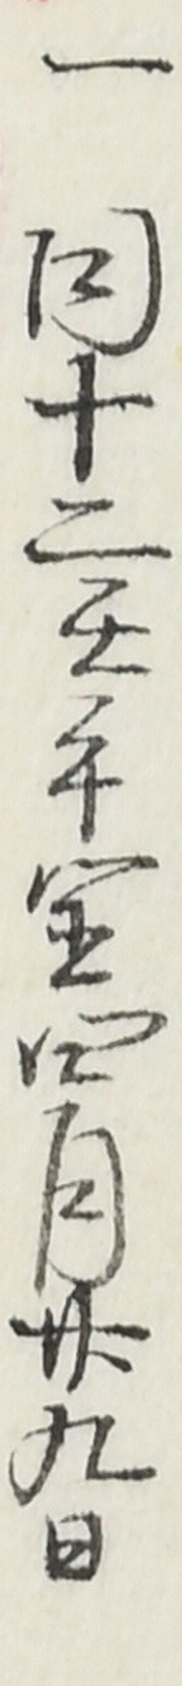一同十二壬午閏四月廿九日

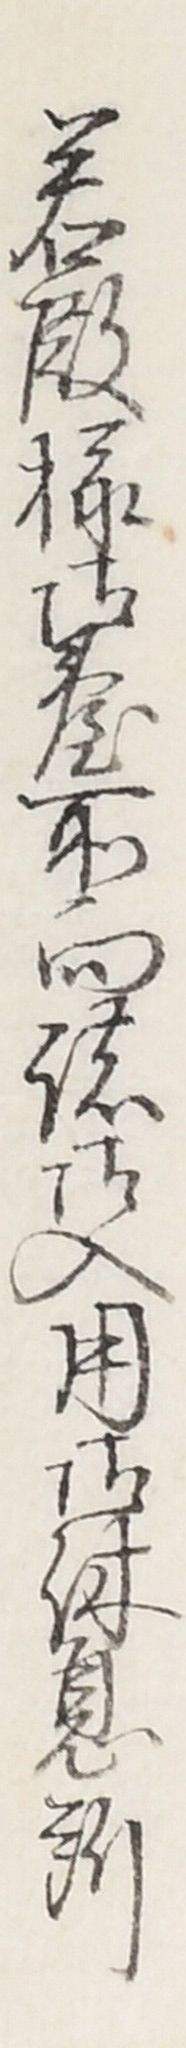若殿様御台所向諸御入用御休息所
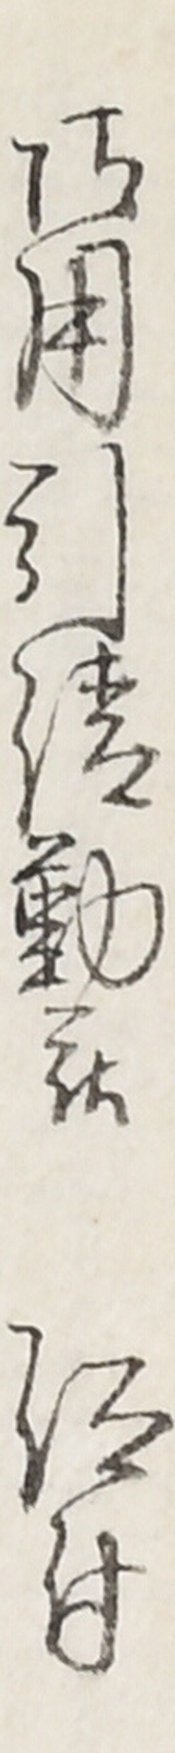御用引請勤被仰付
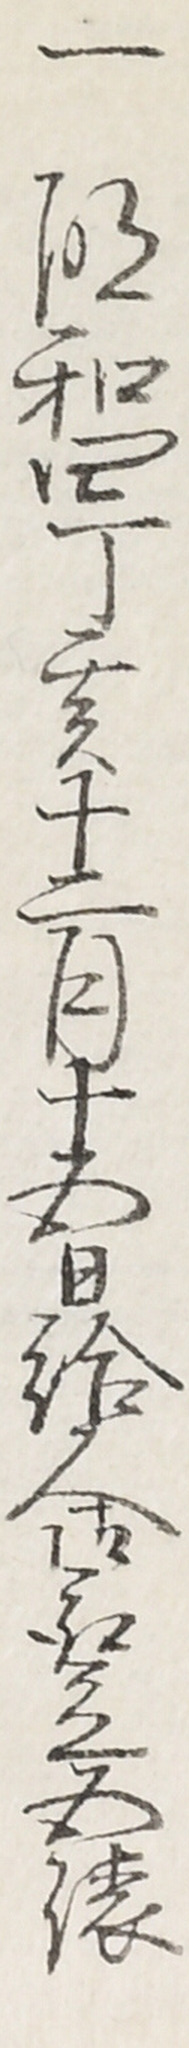一明和四丁亥十二月十五日給人御取立五俵
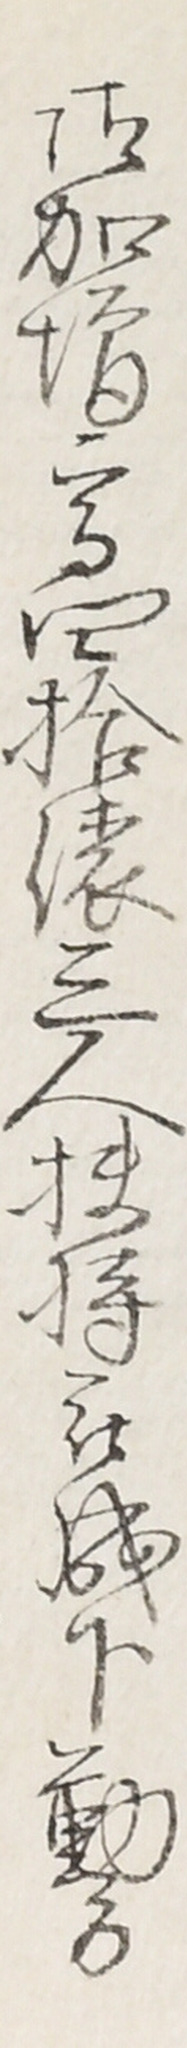御加増高四拾俵三人扶持被成下勤方
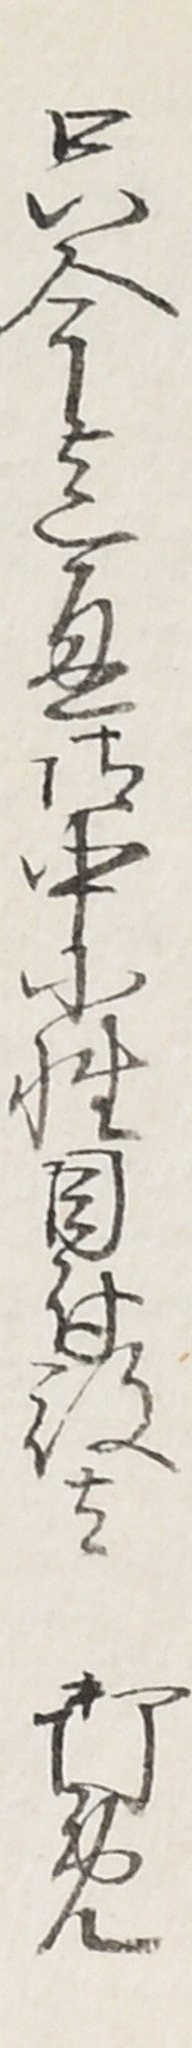只今迄通御中小性目付役は御免
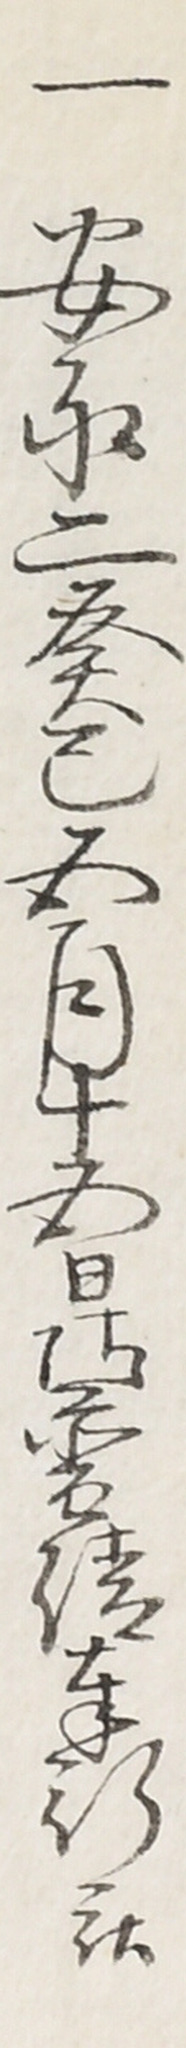一安永二癸巳五月十五日御普請奉行被
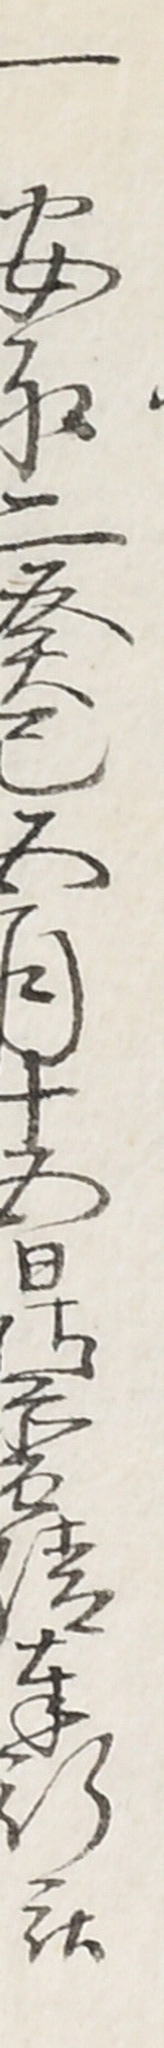一安永二癸巳五月十五日御普請奉行被
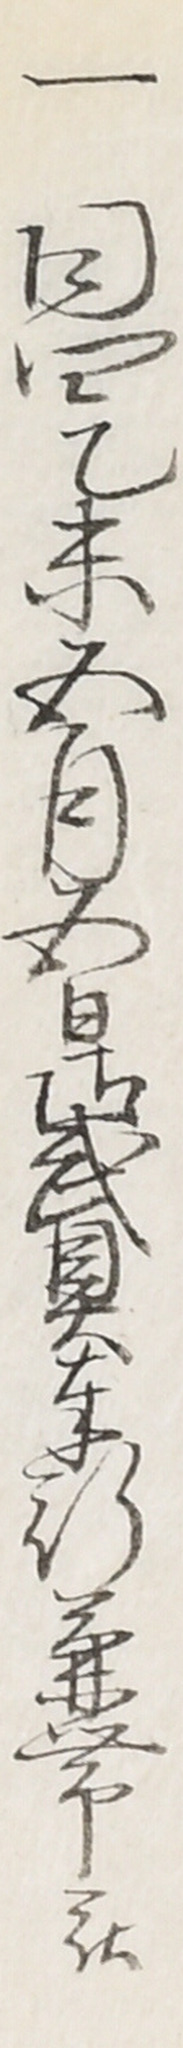一同四乙未五月五日御武具奉行兼帯被
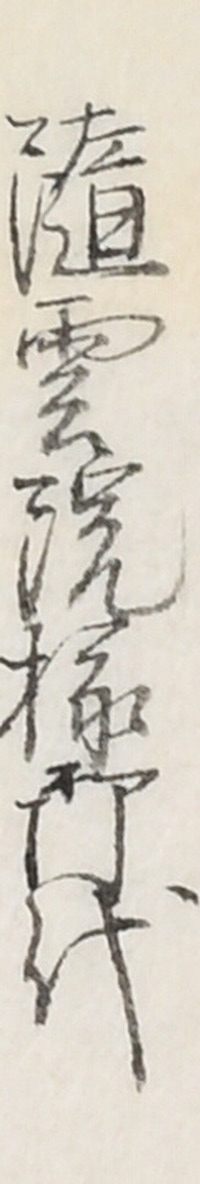隨雲院様御代
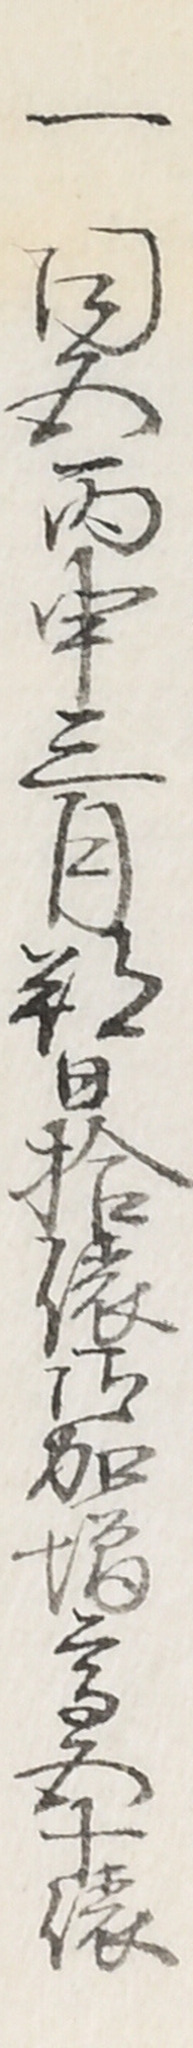一同五丙申三月朔日拾俵御加増高五十俵
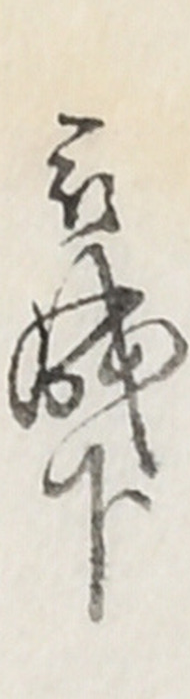被成下
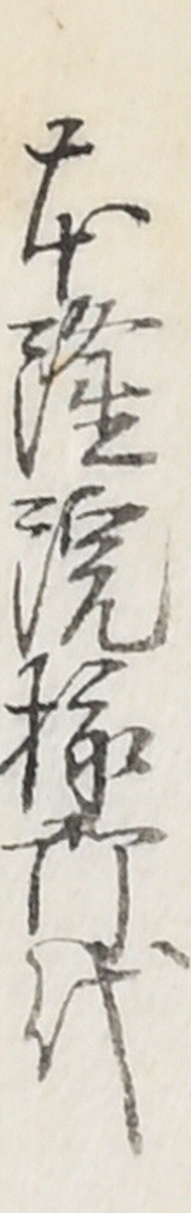本隆院様御代
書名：給人諸士勤仕録（七）
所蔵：伊那市立高遠町図書館・合同会社AMANE
